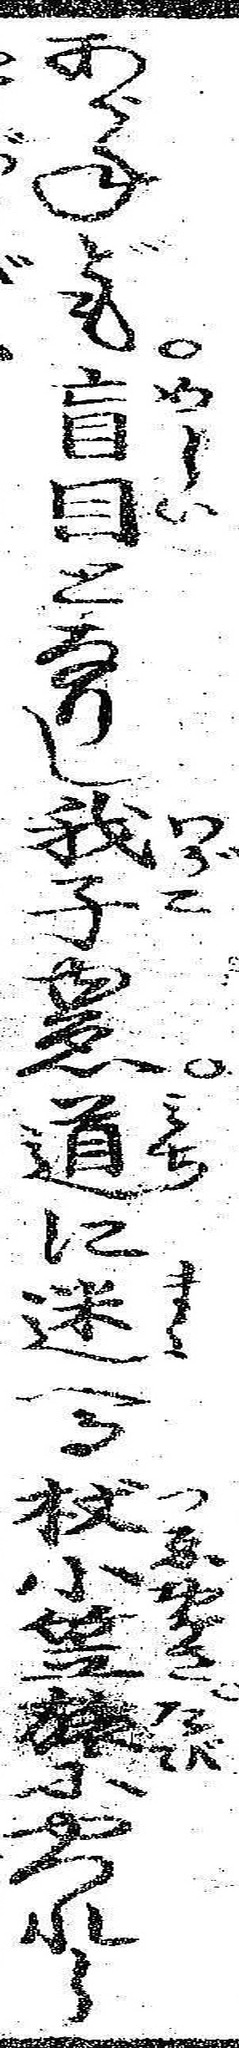あらねども。盲目となりし我子ゆゑ。道に迷へる杖小笠。旅にやつれし
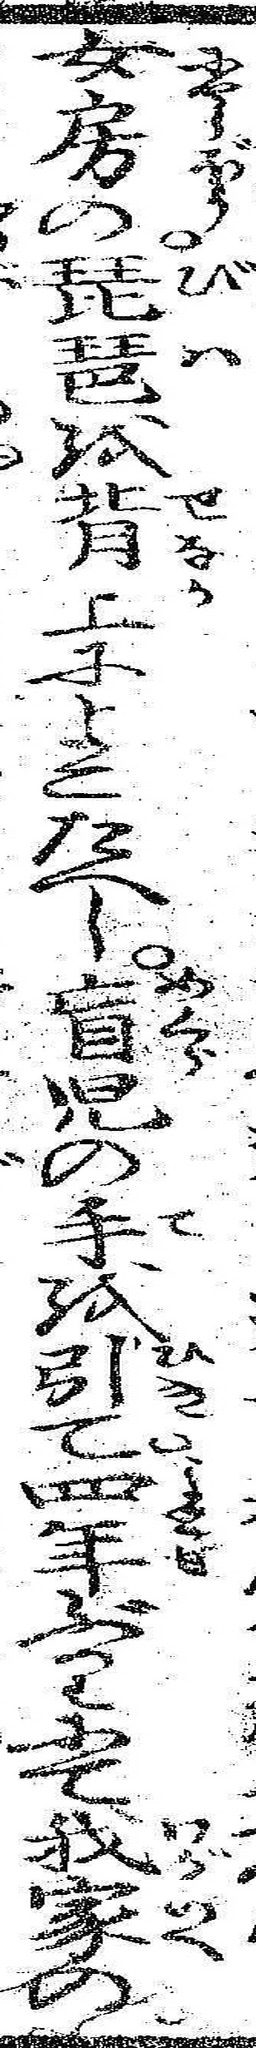女房の。琵琶を背上によこたへし。盲児の手を引て。四年ぶりにて我家の。
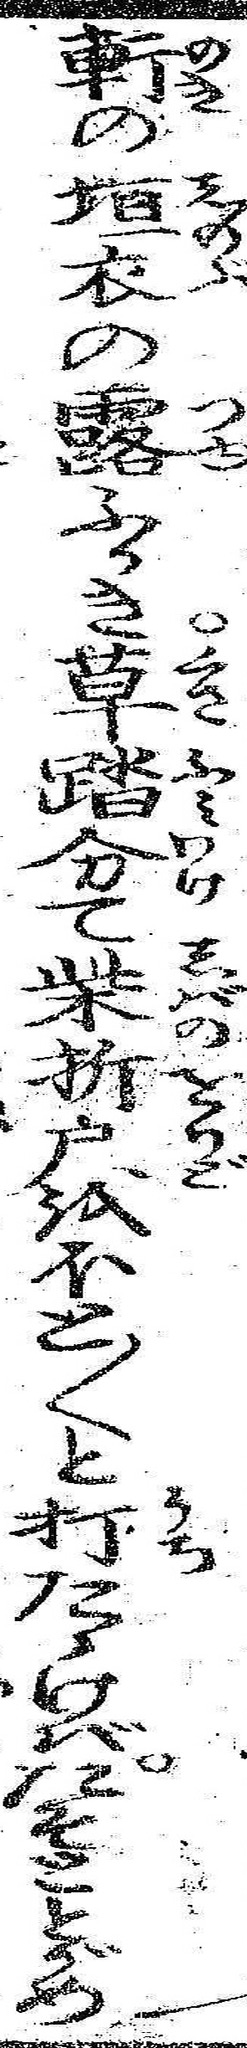軒の垣衣の露ふかき。草踏分て柴折戸をほと〳〵と打たゝけば。たそととがめ
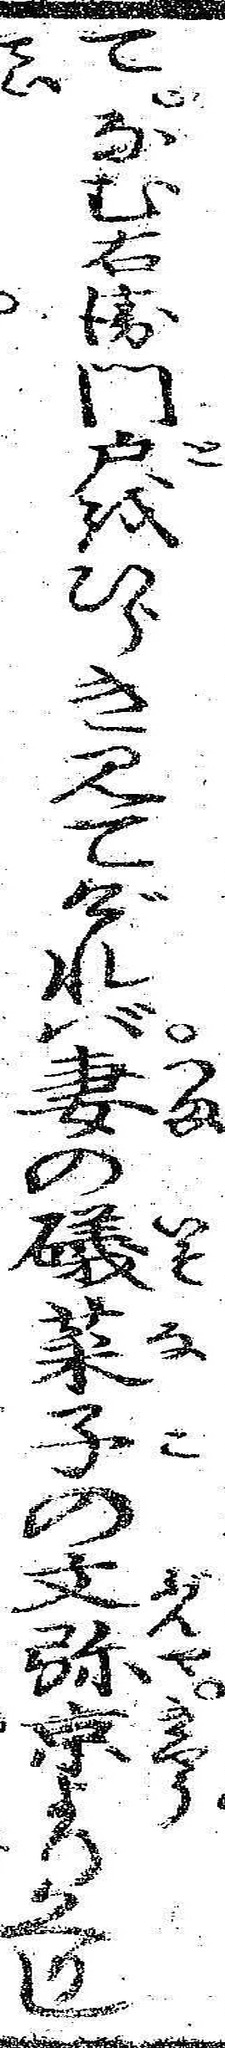て。なむ右衛門戸をひらき見てげれば。妻の礒菜子の文弥。京よりかへりし
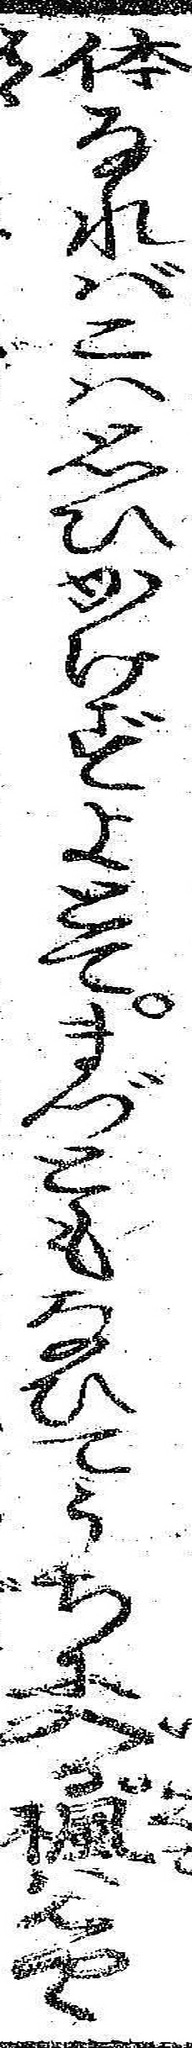体なれば。こは思ひかけずよとて。まづともなひてうちに入る。楓ははやく
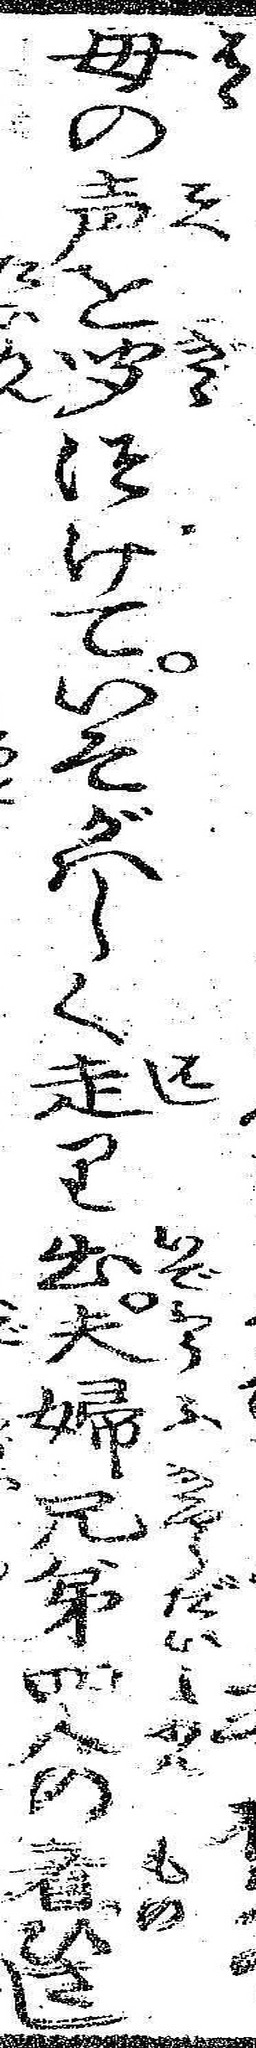母の声を聞つけて。いそがはしく走り出。夫婦兄弟四人の者ひさし
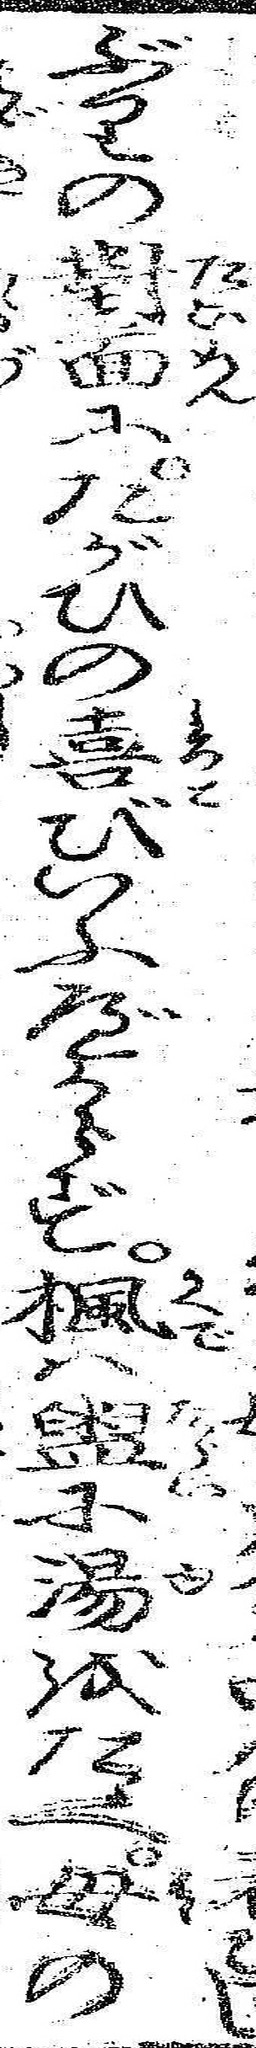ぶりの対面に。たがひの喜びいふべからず。楓は盥に湯をたゝへ。母の
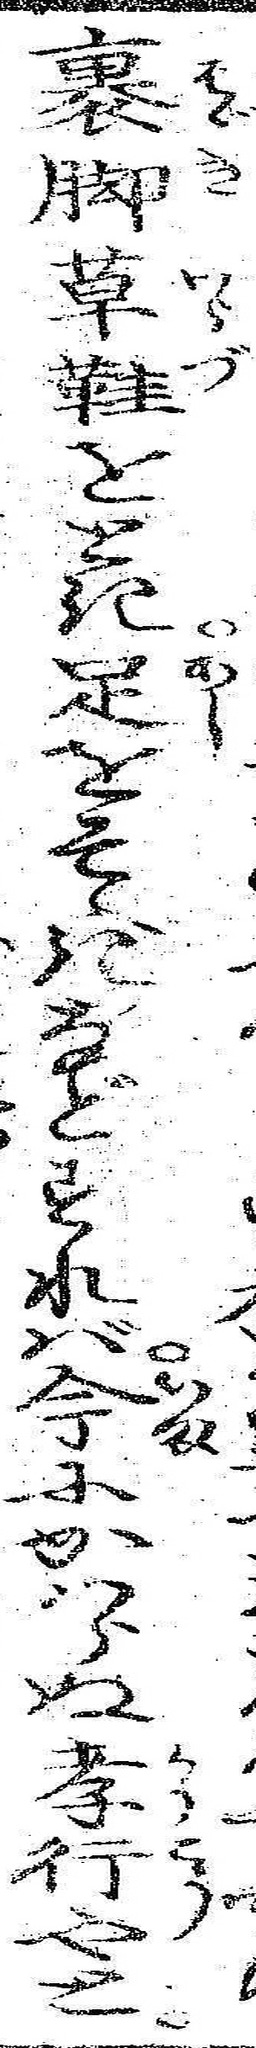裏脚草鞋をとき。足をそゝぎなどすれば。今にかはらぬ孝行やと。
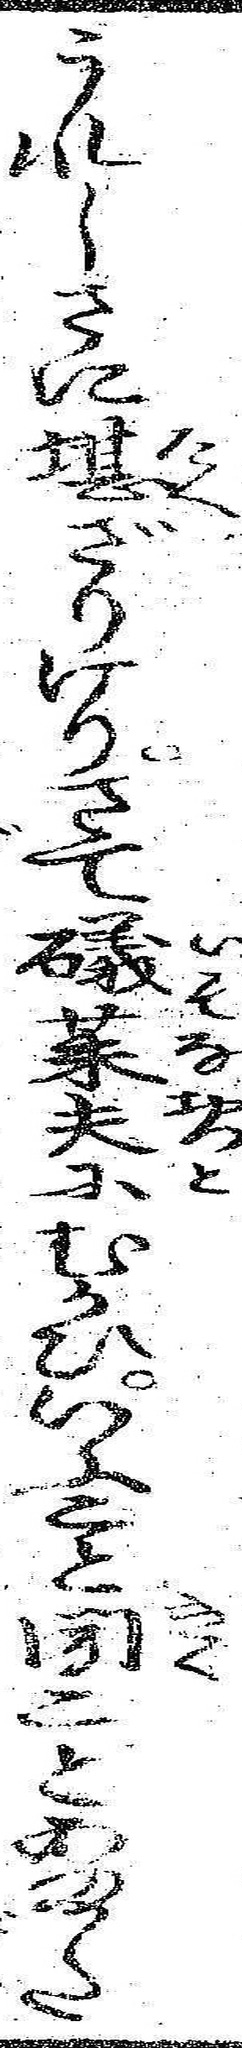うれしさに堪ざりけり。さて礒菜夫にむかひ。いふこと聞ことあまた
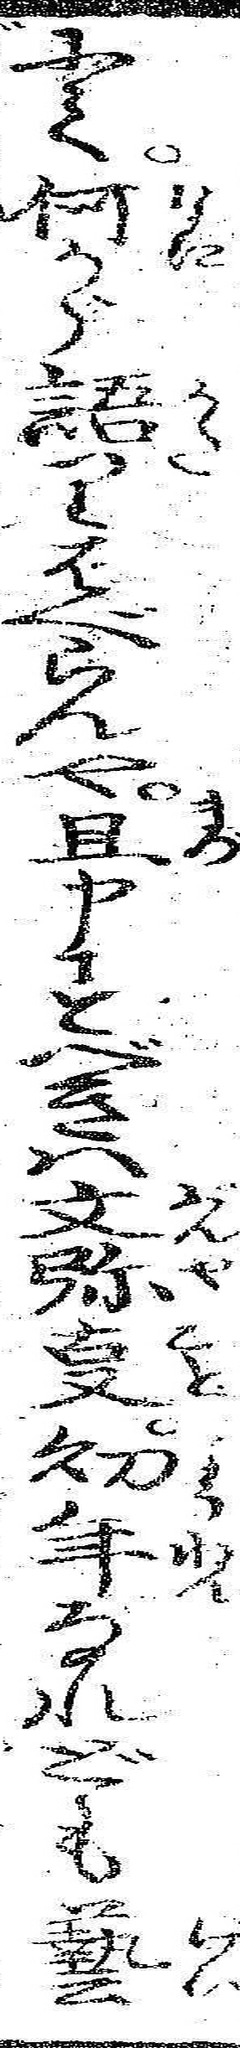にて。何から語りはべらんや。且申すべきは文弥事。幼年なれども芸
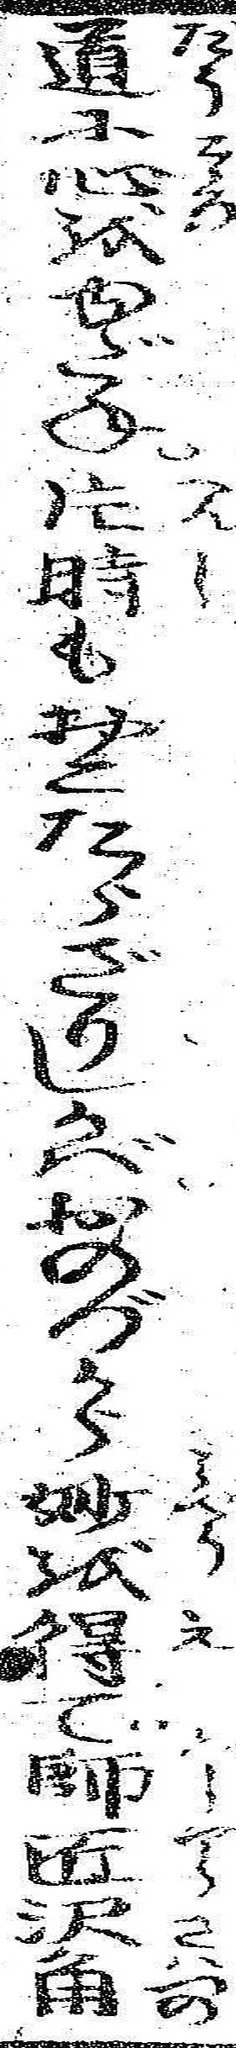道に心をゆだね。片時もおこたらざりしかばおのづから妙を得て。師匠沢角
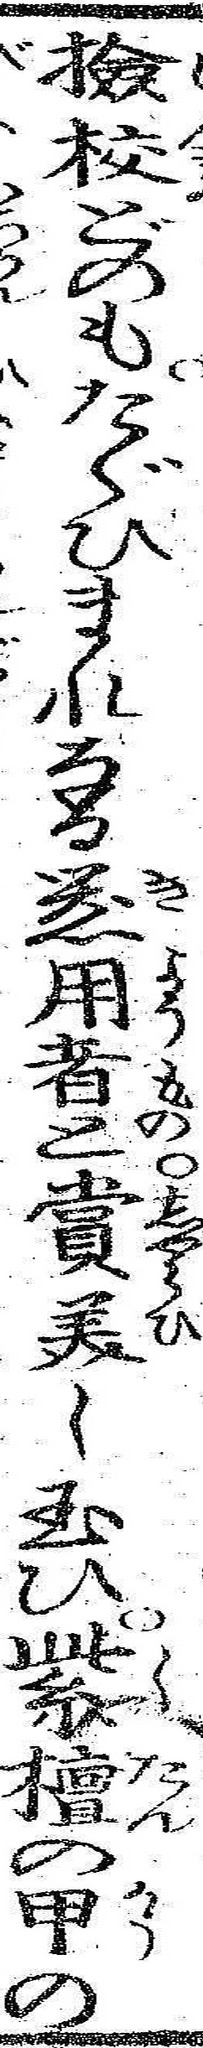検校どのも。たぐひまれなる器用者と。賞美し玉ひ。紫檀の甲の
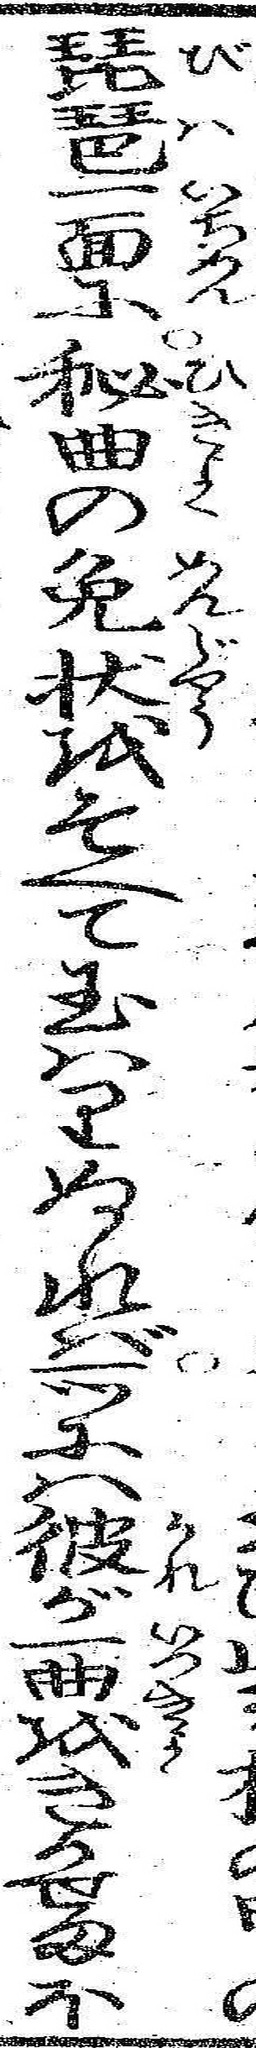琵琶一面に。秘曲の免状をそへて玉はりぬれば。一ツには彼が一曲をきかせまほ
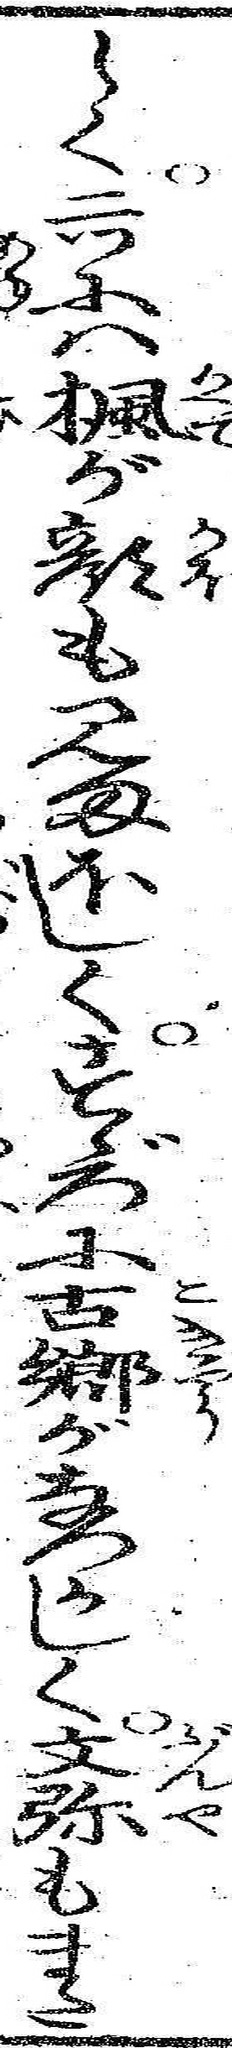しく。二ツには楓が顔も見まほしく。すゞろに古郷がなつかしく。文弥もまた
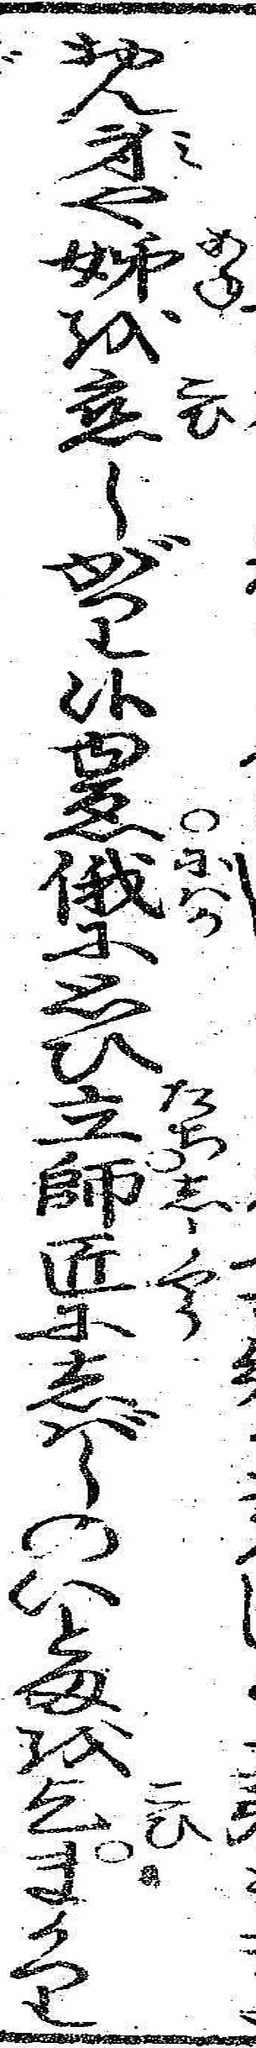おん身や姉を恋しがり候ゆゑ。俄に思ひ立。師匠にしばしのいとまを乞。まかり
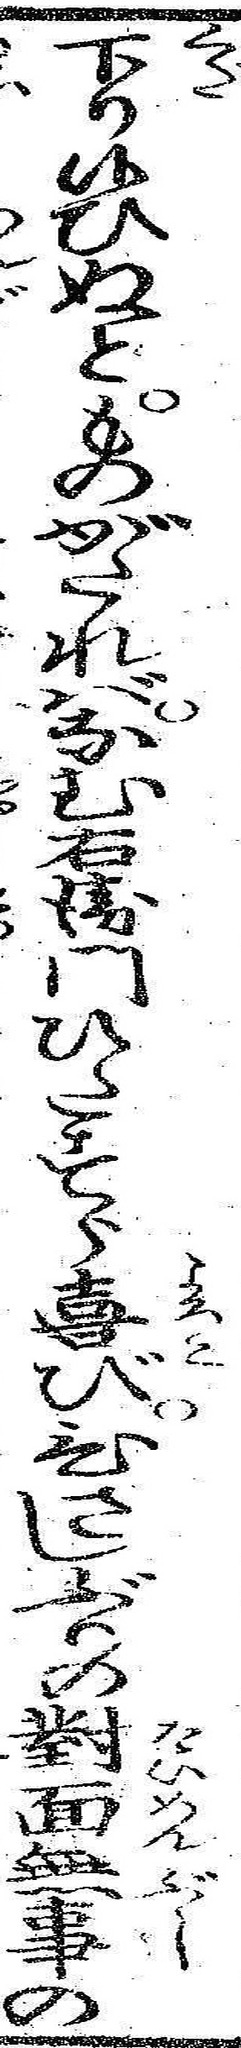下り候ひぬと。ものがたれば。なむ右衛門ひたすら喜び。ひさしぶりの対面無事の
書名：昔話稲妻表紙
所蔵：国文学研究資料館
